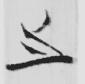之
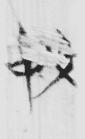{戈才}
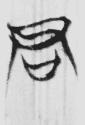君
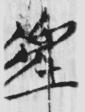𫊟
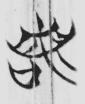若
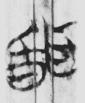䎽
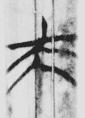夫
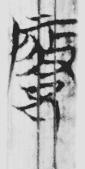{殷邑}
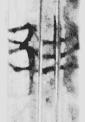邦
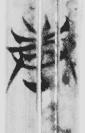庚
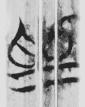爲
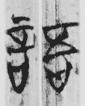語
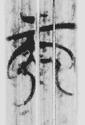而
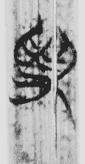受
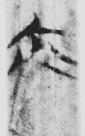亦
